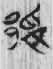○（妥）
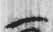一
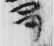邑
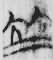竝
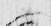一
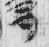邑
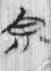余
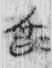爲
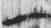一
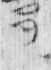邑
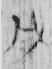凡
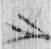之
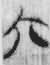六
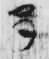邑
